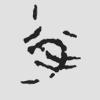八月
